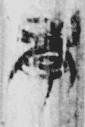孝
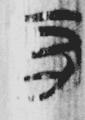唇
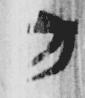方
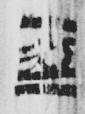爲
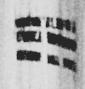三
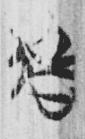俈
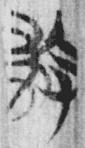救
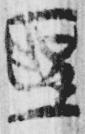聖（聲）
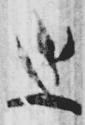之
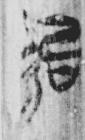○（紀）
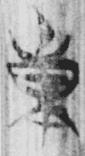東
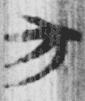方
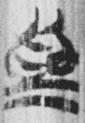爲
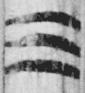三
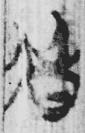俈
